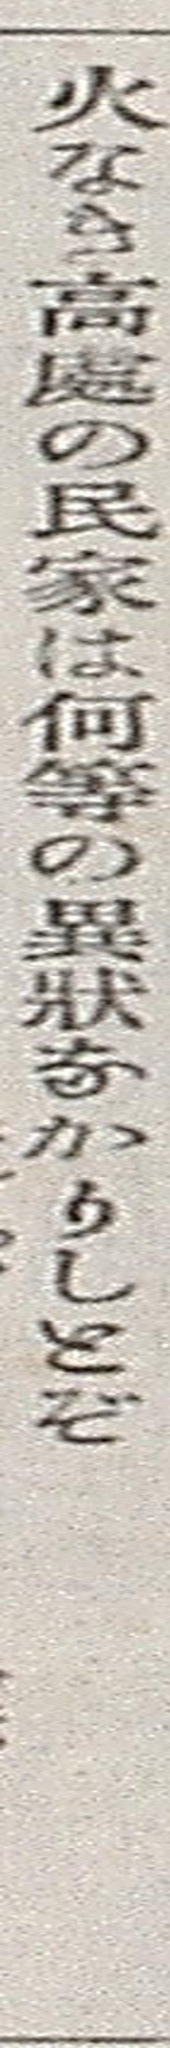火なき高処の民家は何等の異状なかりしとぞ
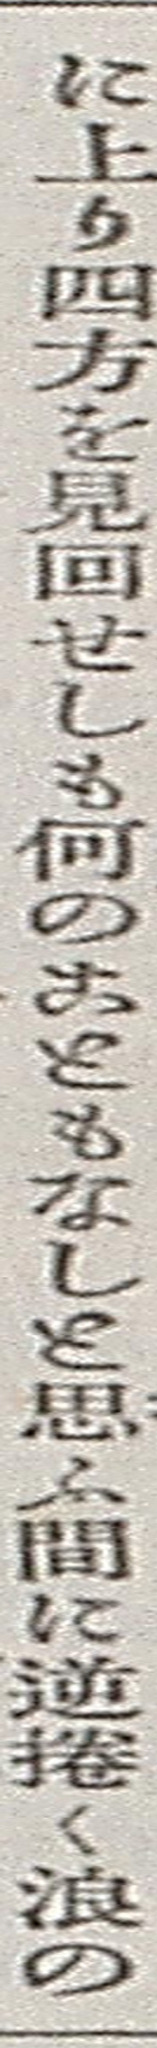に上り四方を見回せしも何のこともなしと思ふ間に逆捲く浪の
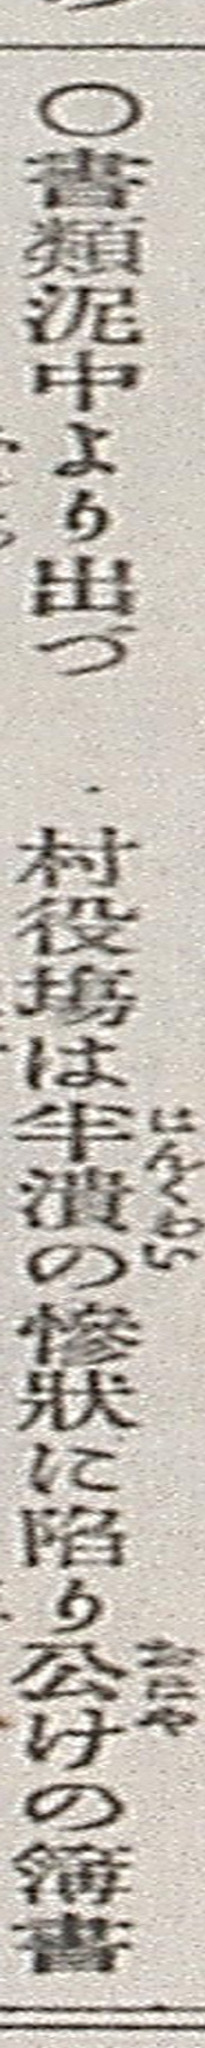○書類泥中より出づ村役場は半潰の惨状に陥り公けの簿書
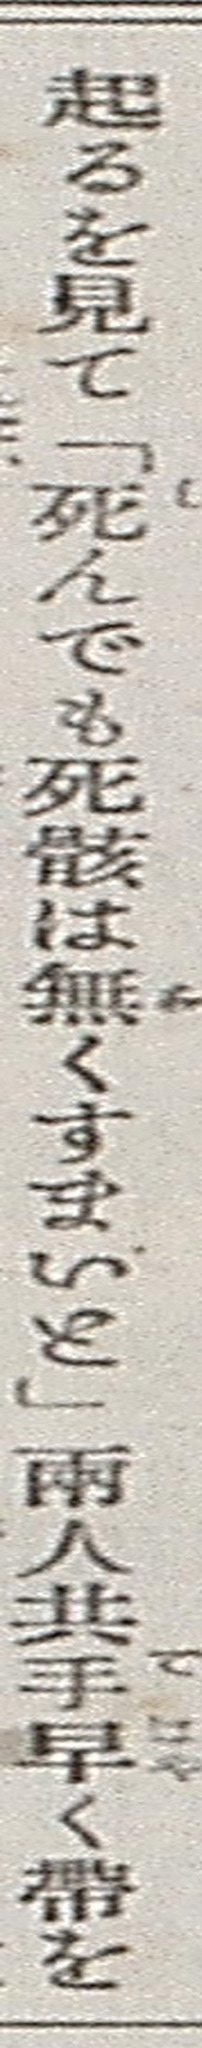起るを見て「死んでも死骸は無くすまいと」両人共手早く帯を
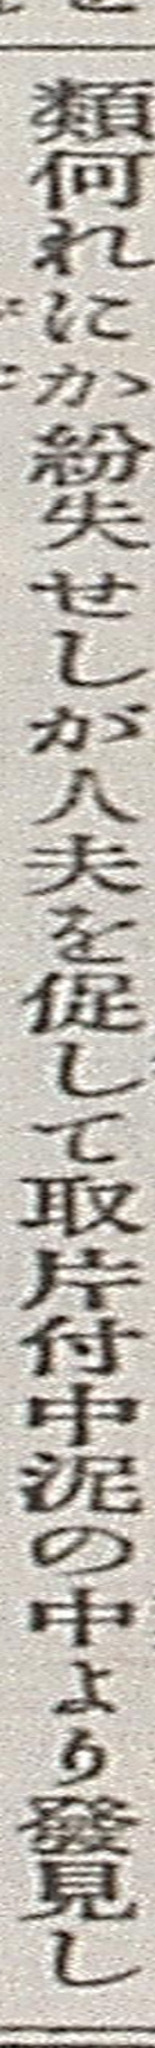類何れにか紛失せしが人夫を促して取片付中泥の中より発見し
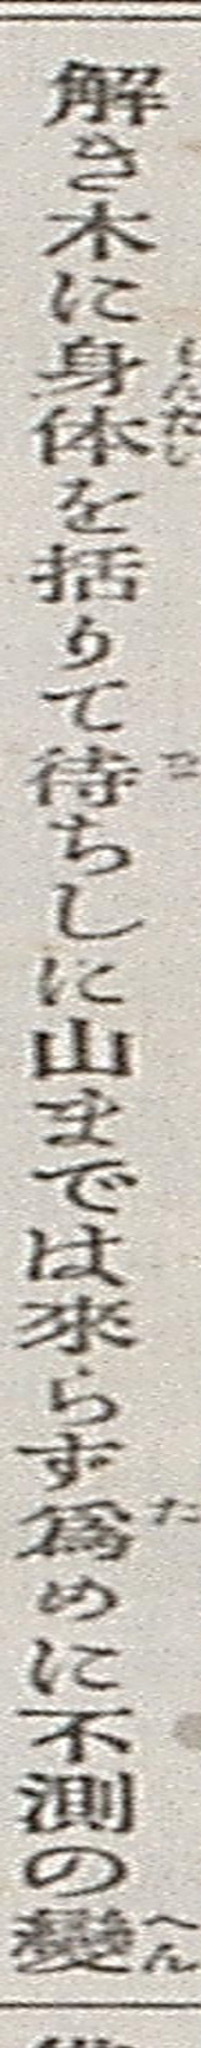解き木に身体を括りて待ちしに山までは来らず為めに不測の変
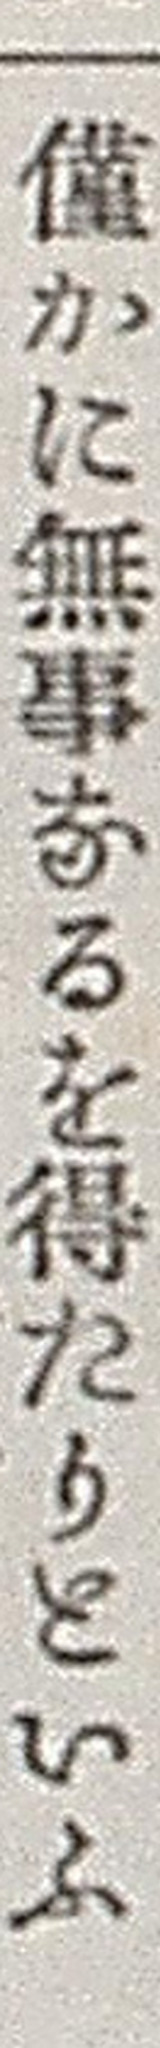僅かに無事なるを得たりといふ
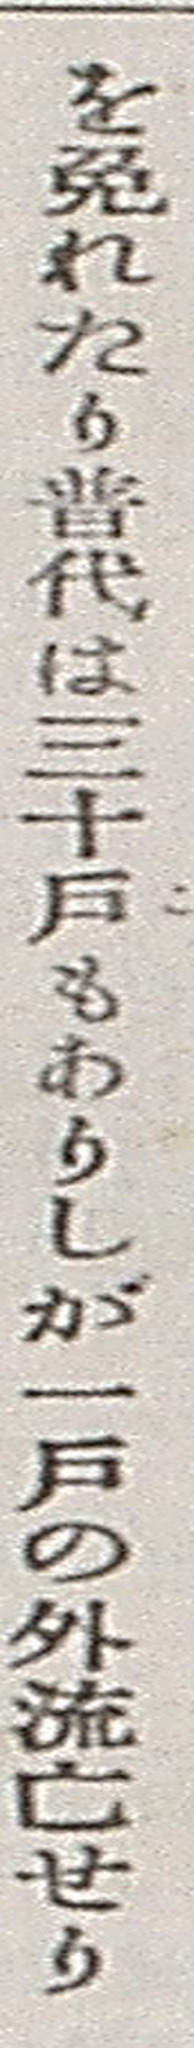を免れたり普代は三十戸もありしが一戸の外流亡せり
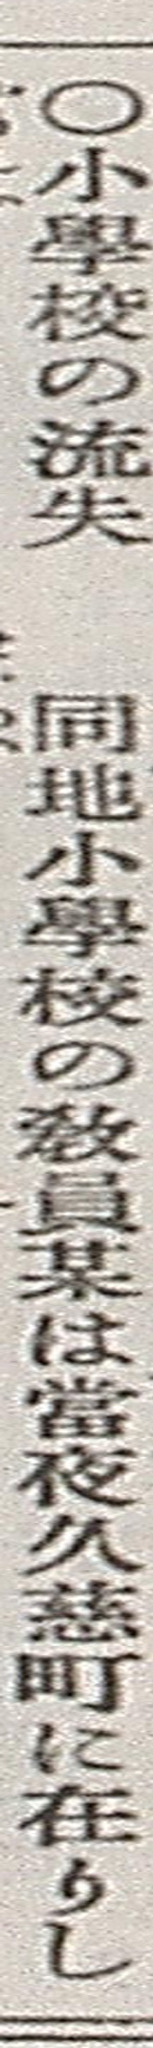○小学校の流失同地小学校の教員某は当夜久慈町に在りし
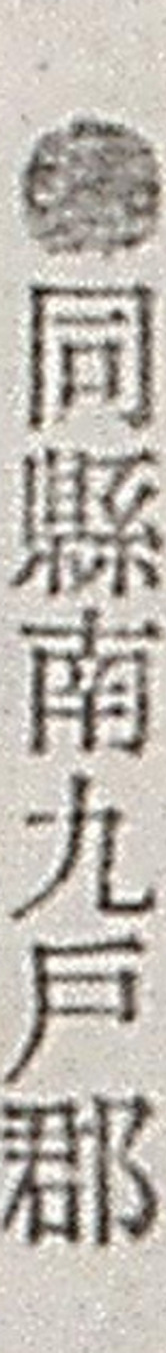●同県南九戸郡
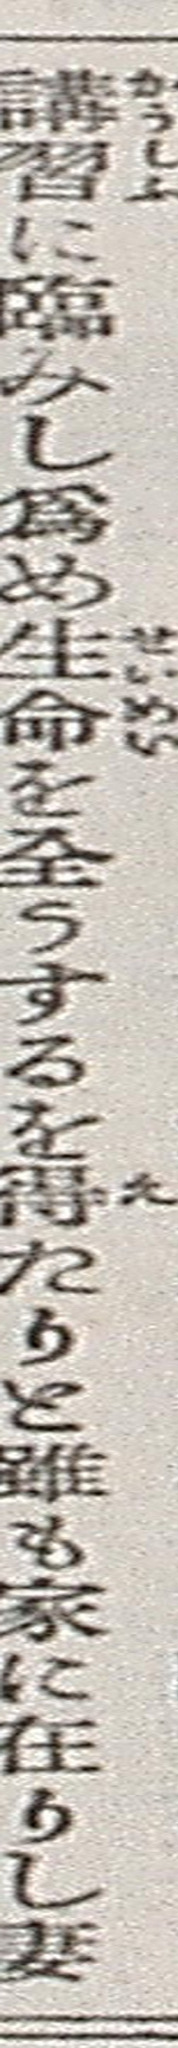講習に臨みし為め生命を全うするを得たりと雖も家に在りし妻
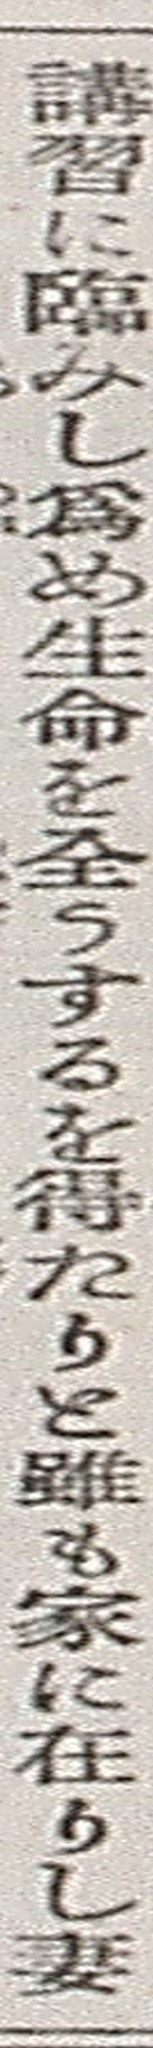講習に臨みし為め生命を全うするを得たりと雖も家に在りし妻
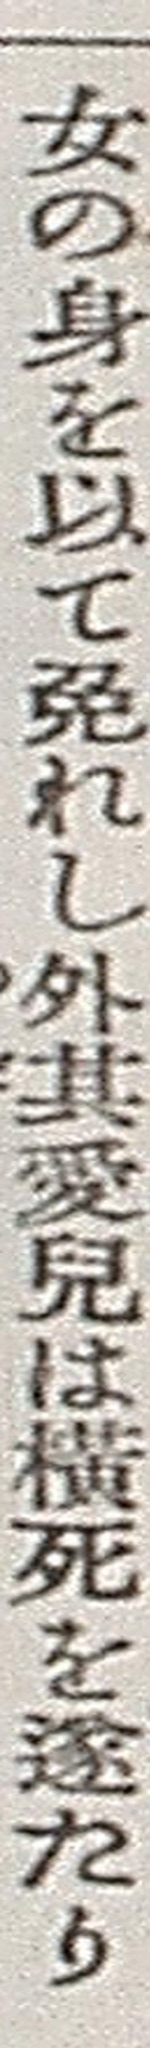女の身を以て免れし外其愛児は横死を遂たり
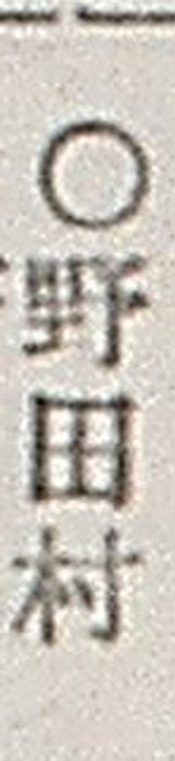●野田村
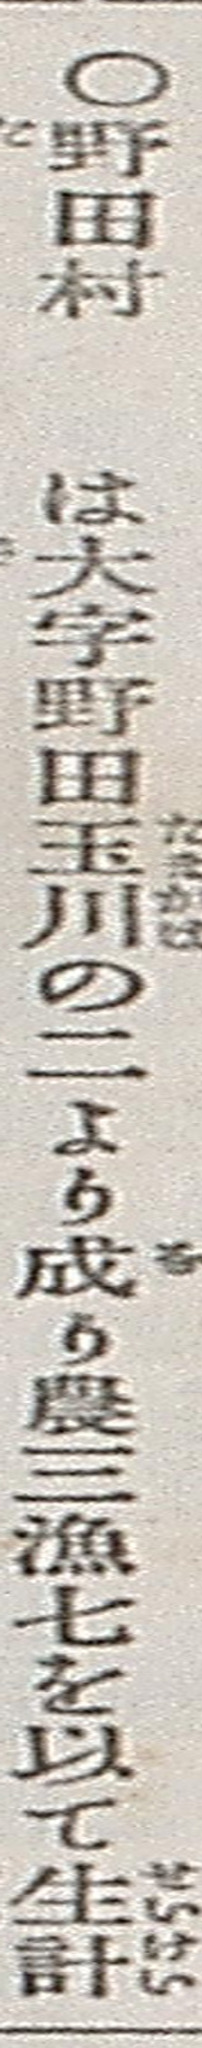○野田村は大字野田玉川の二より成り農三漁七を以て生計
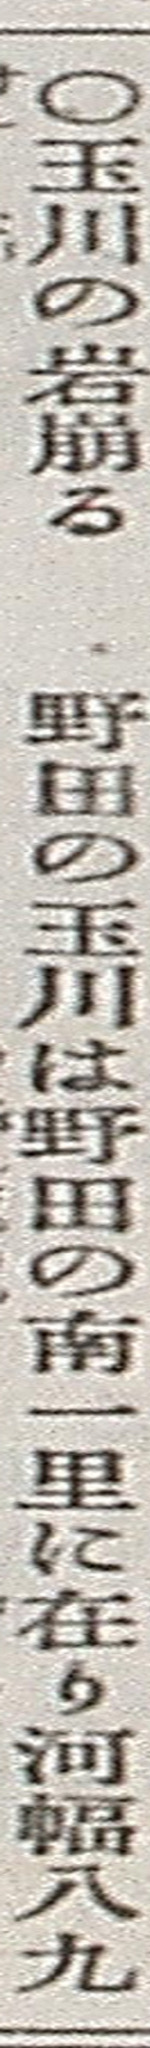○玉川の岩崩る野田の玉川は野田の南一里に在り河幅八九
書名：風俗畫報臨時増刊第百二十號　大海嘯被害録（下）
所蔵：東京大学地震研究所図書室 Earthquake Research Institute Library, The University of Tokyo, JAPAN
